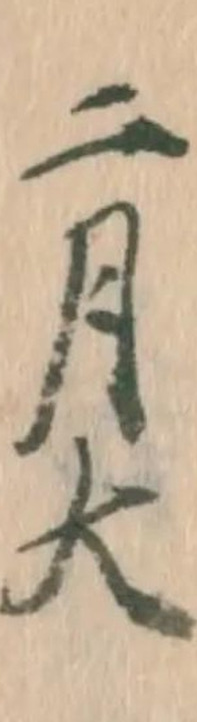二月大
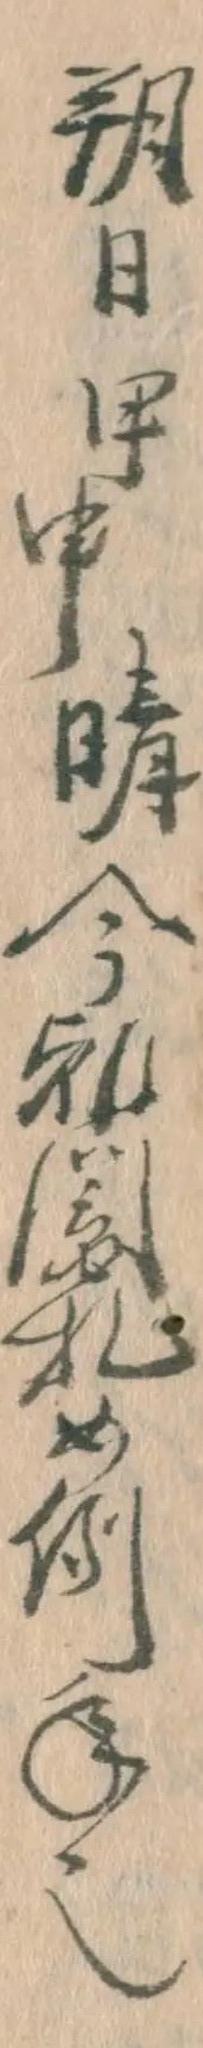朔日甲申晴今朝鬮札如例年也
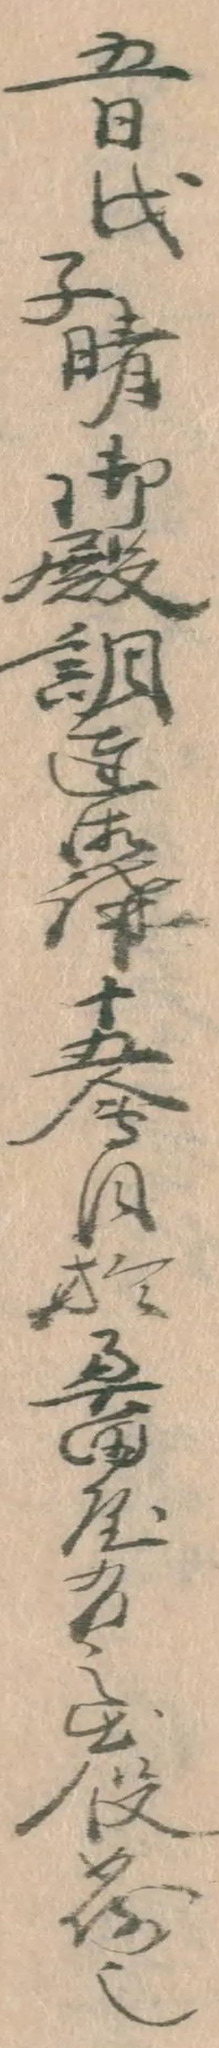五日戊子晴御殿調達御講十五會目於奥田屋有之出役如例也
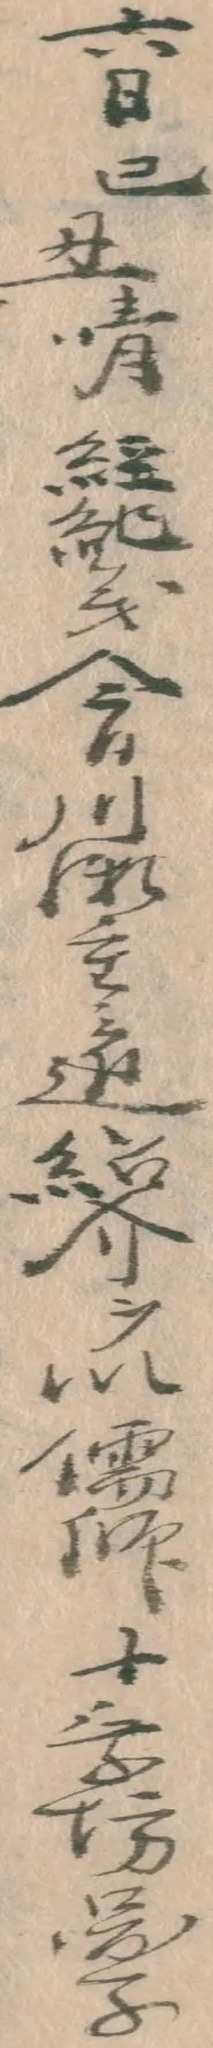六日己丑晴経紀義今日川瀬重之近紹介ヲ以儒師十乗坊図子
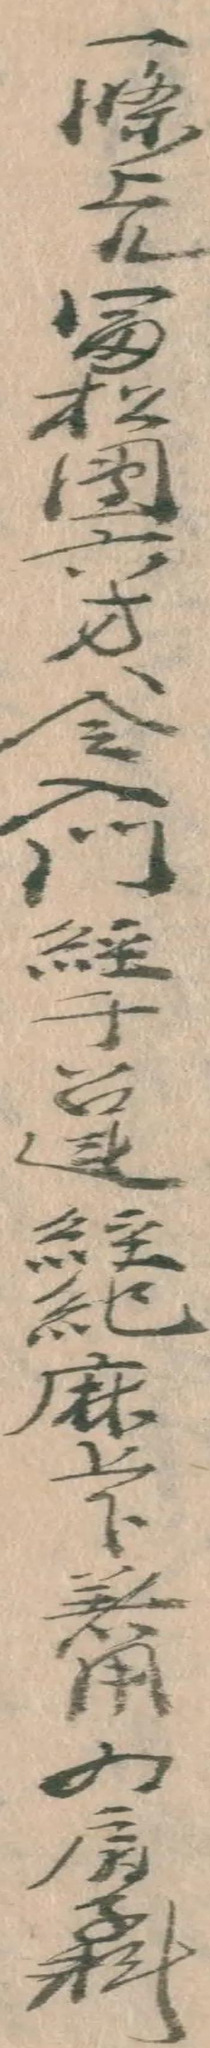一条上ル冨松團六方へ令入門経千召連経紀麻上下着用為扇子料
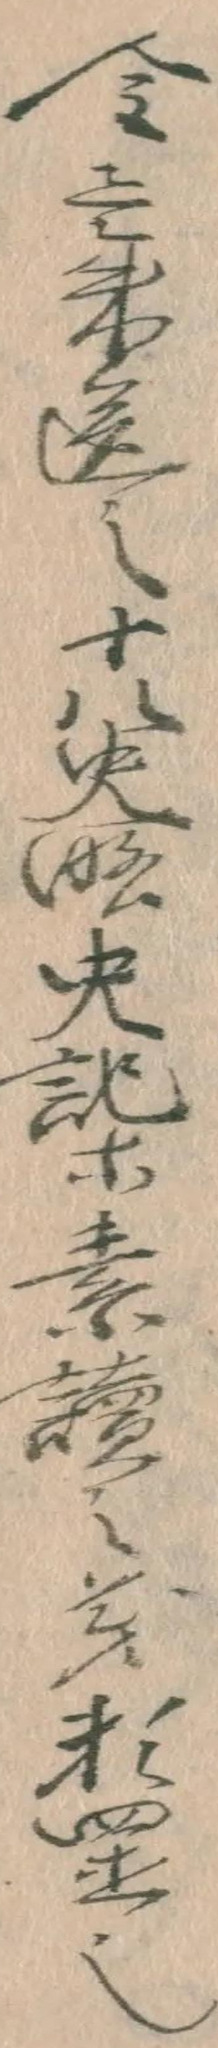金壱朱送之十八史略史記等素讀之義頼置也
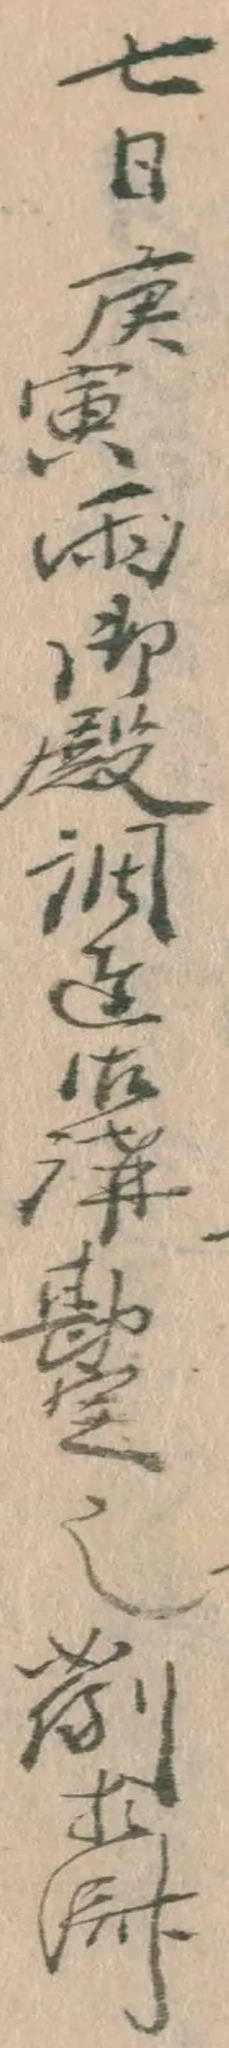七日庚寅雨御殿調達御講勘定也如例相済
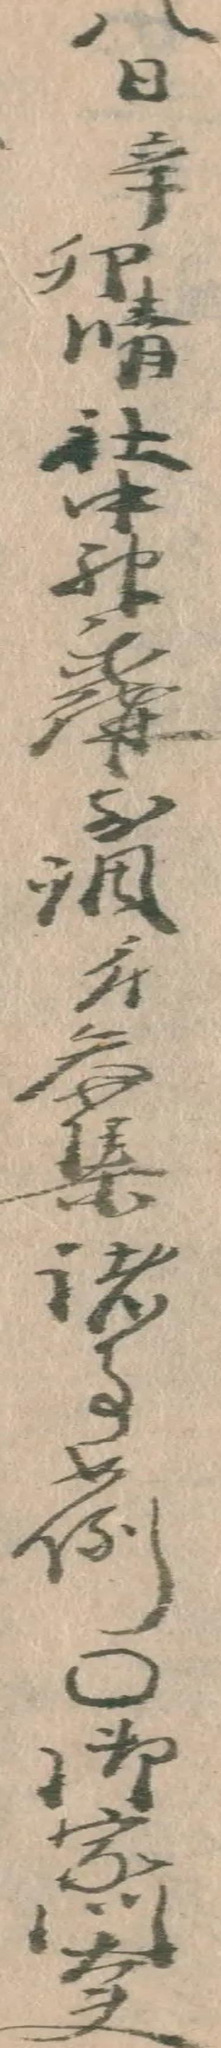八日辛卯晴社中神楽講前調ニ付参集諸事如例〇御家門大夫
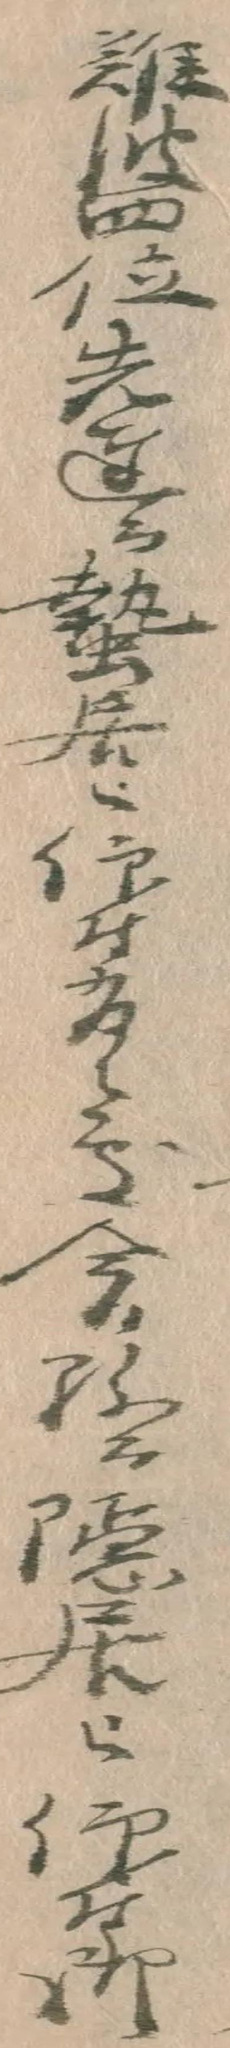難波四位先達而蟄居被仰付有之處今日弥而隠居被仰付御
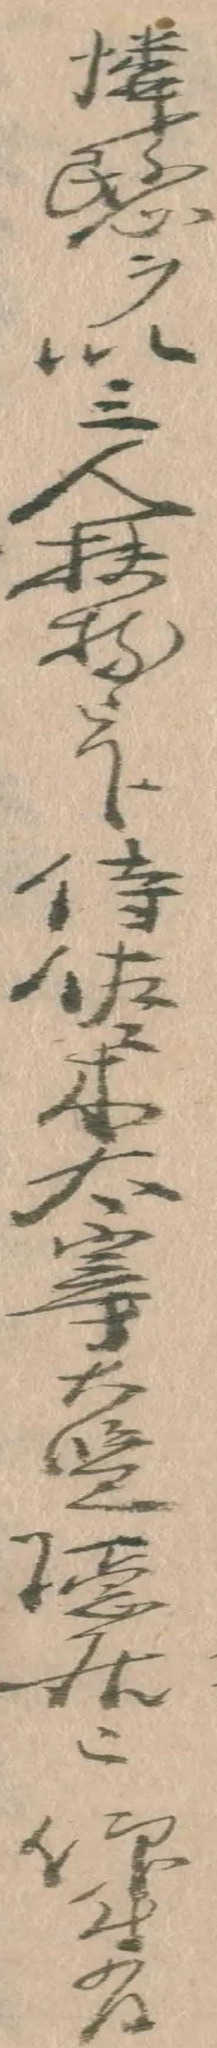憐愍ヲ以三人扶持被下侍佐々木太宰大監隠居被仰付有
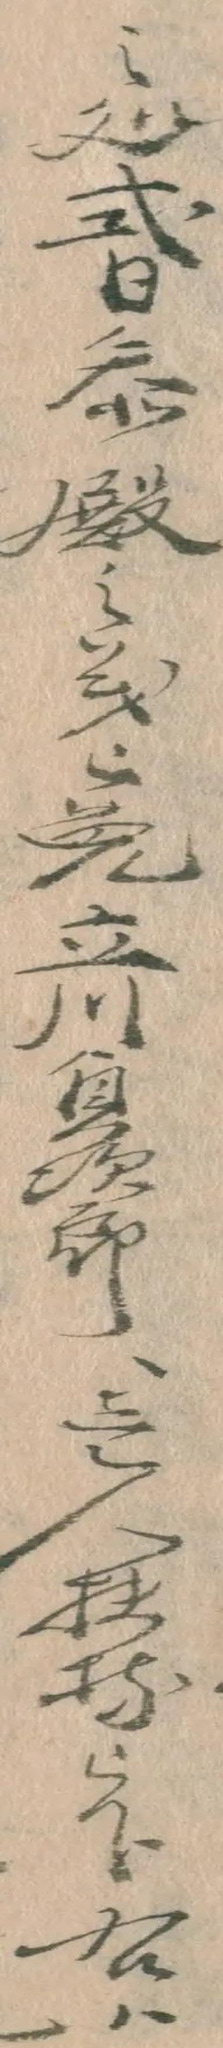之処式日参殿之義被免立川貞次郎へ壱人扶持被下右ハ
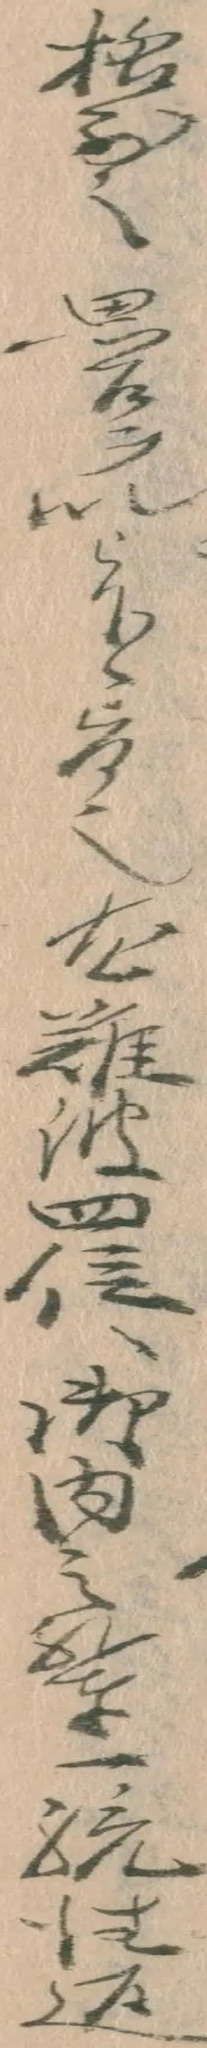格別之思召ヲ以被下候旨也尤難波四位へ御内之輩一統往返
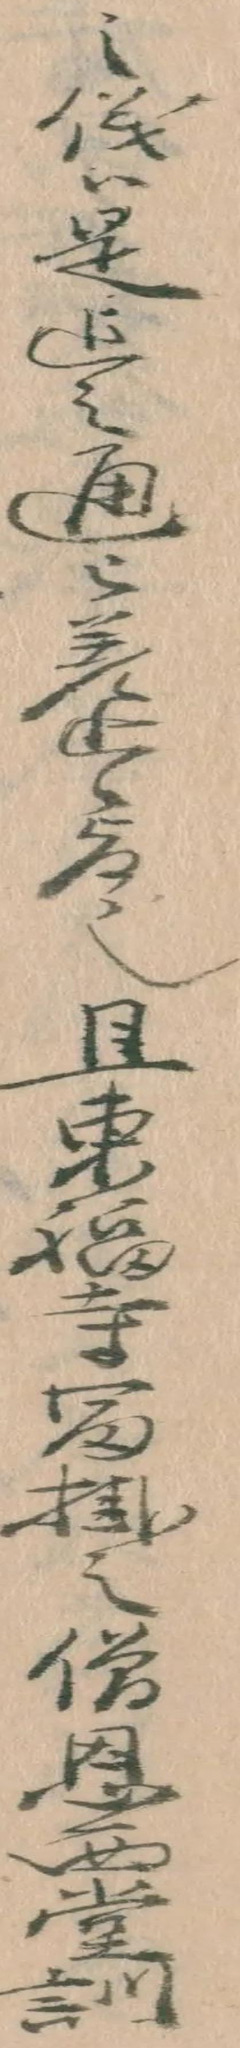之儀ハ是迄之通被差止候旨也且東福寺冨掛之僧恩西堂訓
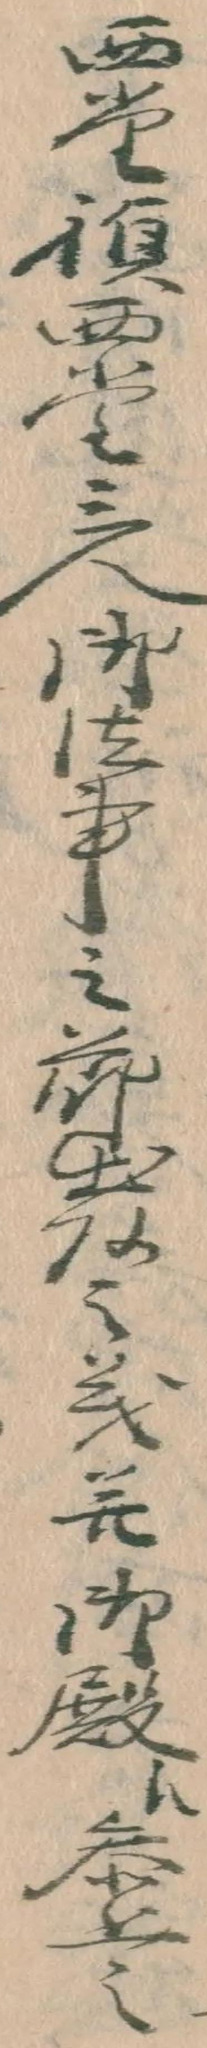西堂禎西堂三人御法事之節出頭之義并御殿え参上之
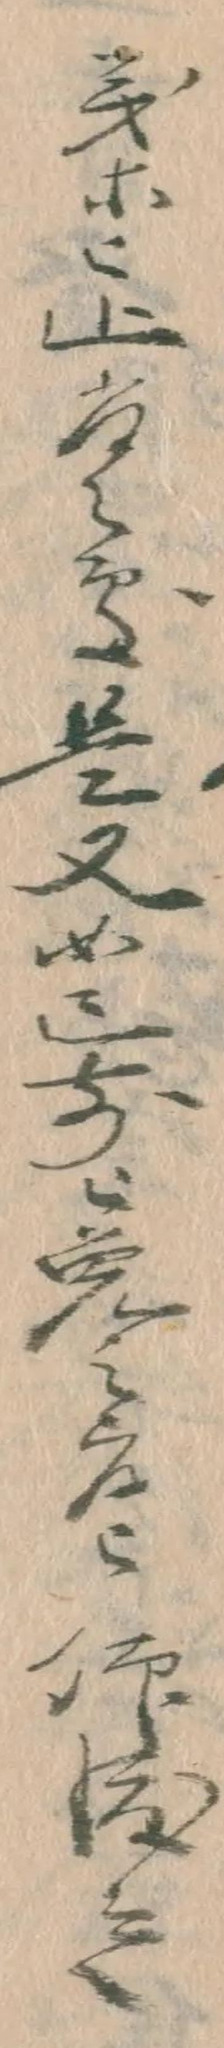義等被止有之處是又如已前被免之旨被仰渡也
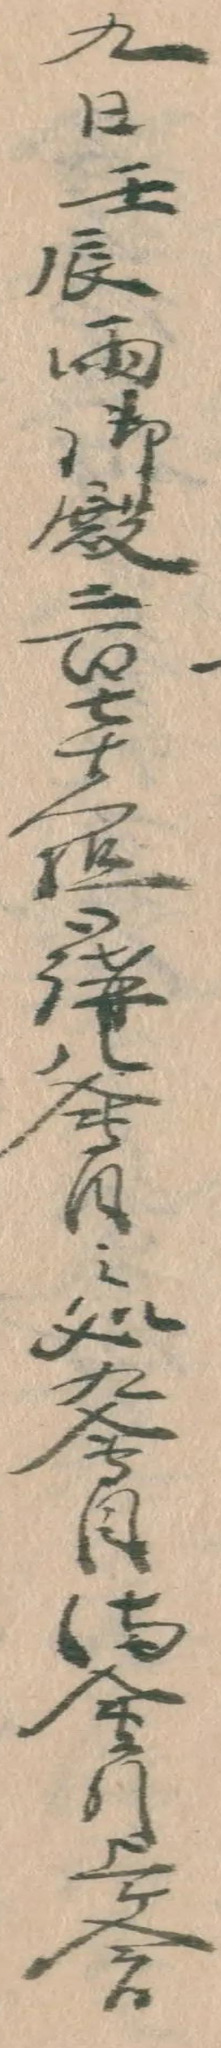九日壬辰雨御殿二百七十人但御講八會目之処九會目満會引上ケ今日
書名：賀茂社記録. 第66冊
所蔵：国立国会図書館 National Diet Library, JAPAN
